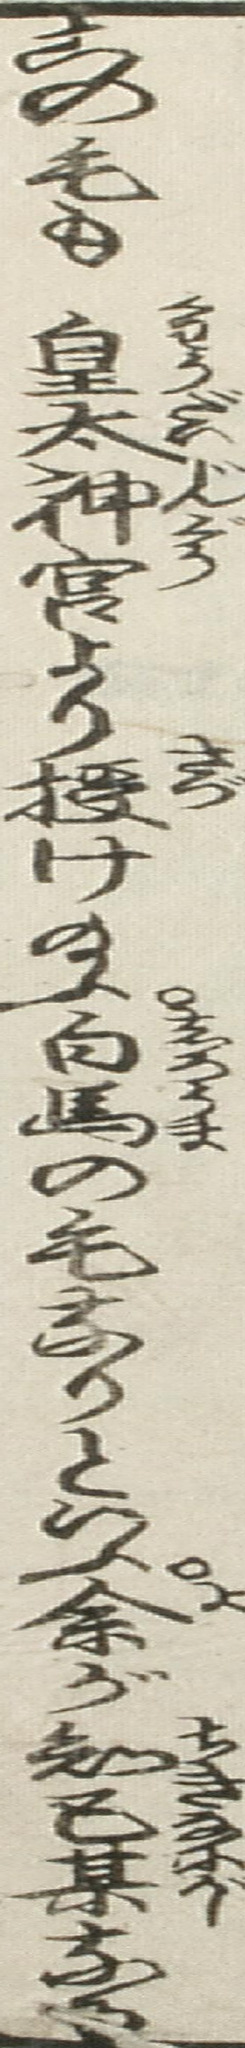この毛も皇太神宮より授け給ふ。白馬の毛なりといふ。余が知己某なる
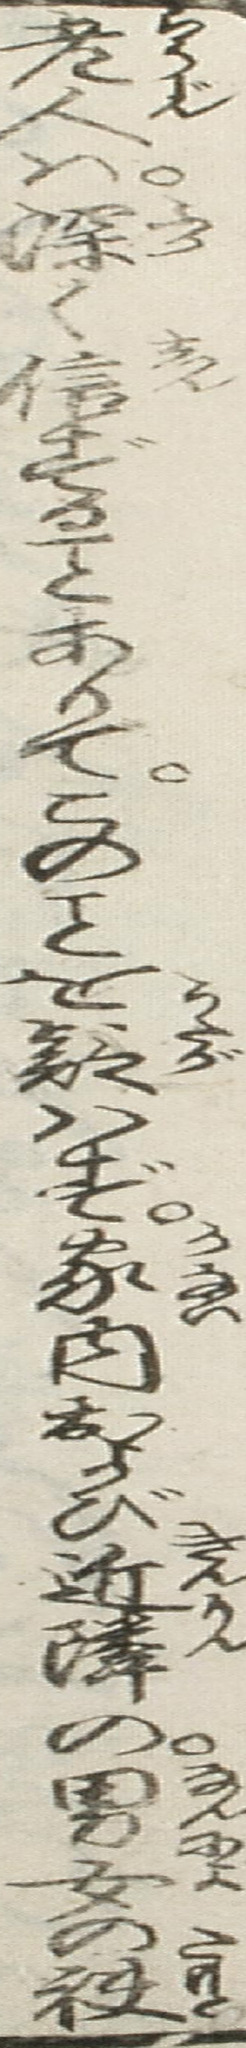老人は。深く信ずることありて。このことを疑はず。家内および近隣の。男女の袂
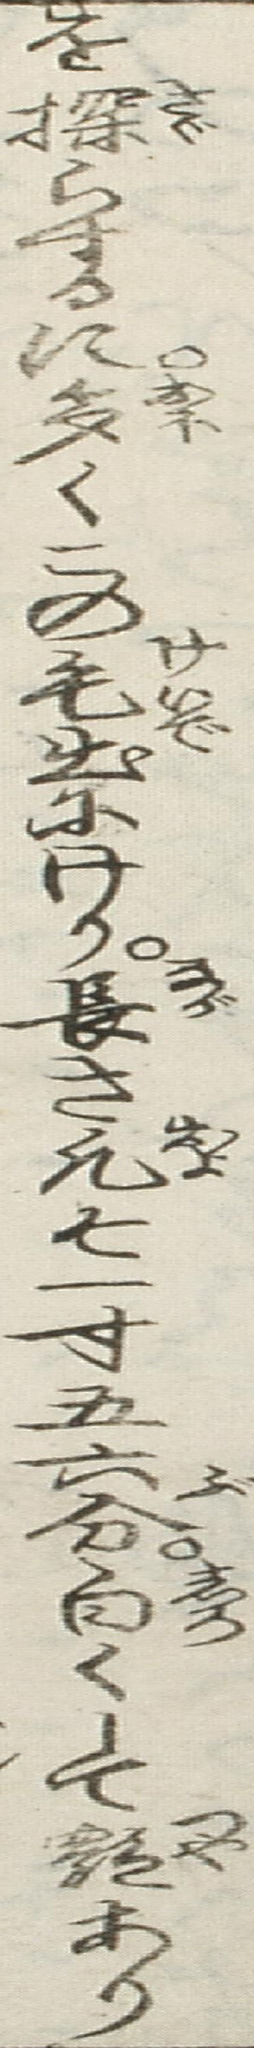を探らするに。多くこの毛出にけり。長さ凡そ一寸五六分。白くして艶あり
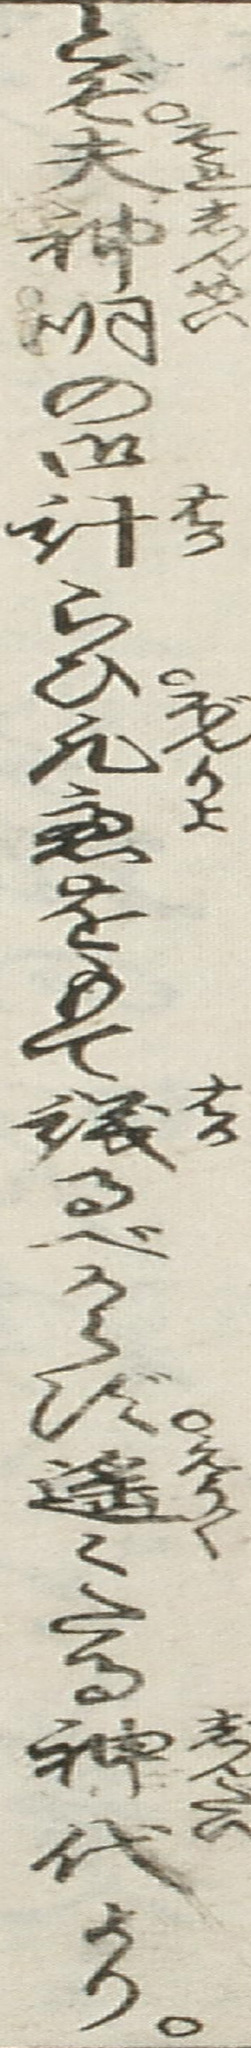とぞ。夫神明の御計らひ。凡慮をもて議るべからず。遥々たる神代より。
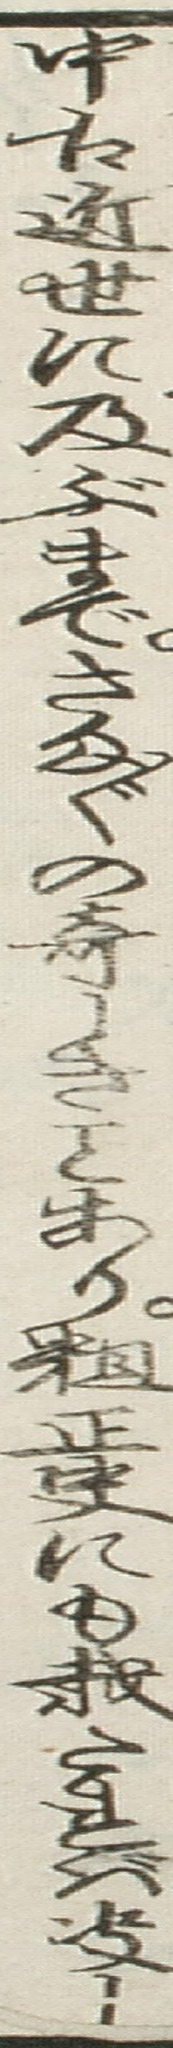中古近世に及ぶまで。さま〴〵の奇しきことあり。粗正史にも載たれば。決し
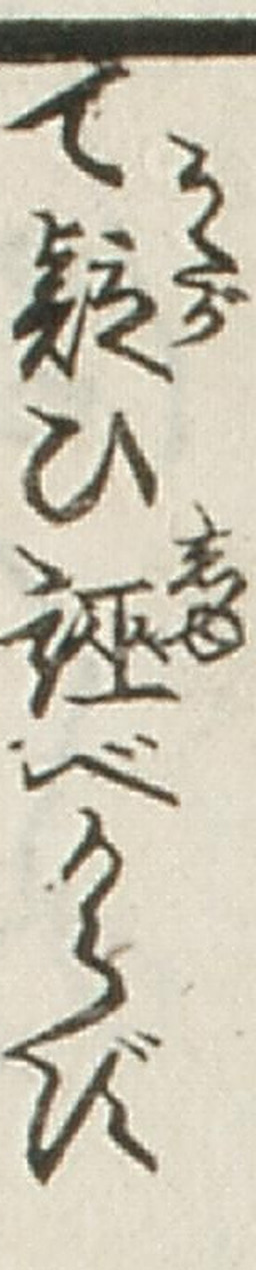て疑ひ誣べからず
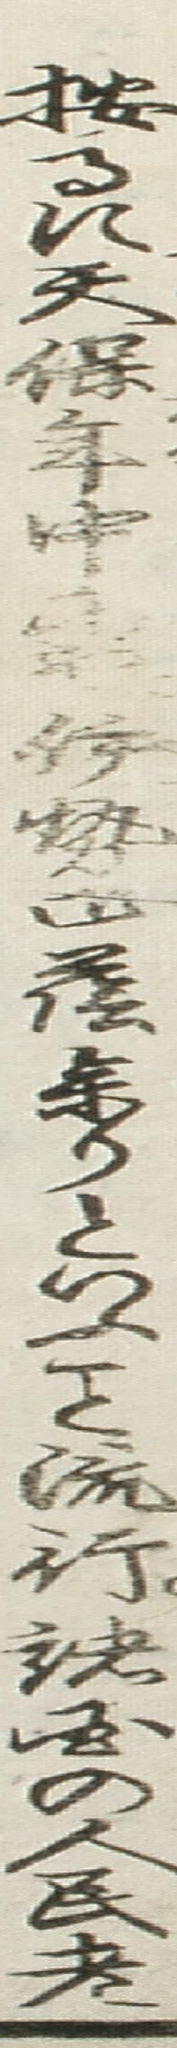按るに天保年中にや。伊勢御蔭参りといふこと流行。諸国の人民老
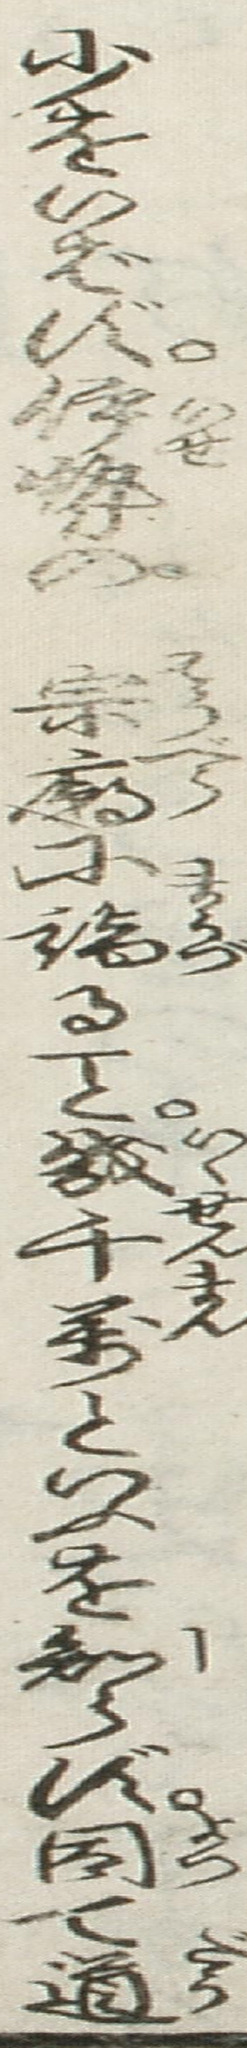少をいばず。伊勢の宗廟に詣ること。幾千万といふを知らず。因て道
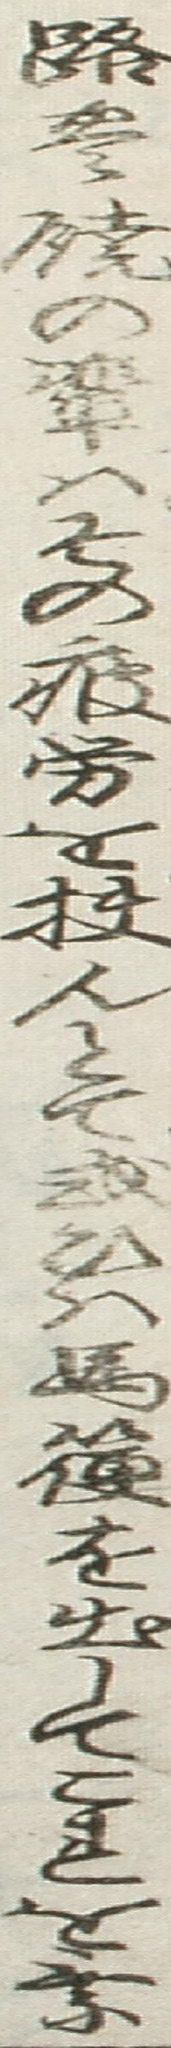路豊饒の輩は。その疲労を扶んとて。或ひは馬箯を出してこれを乗
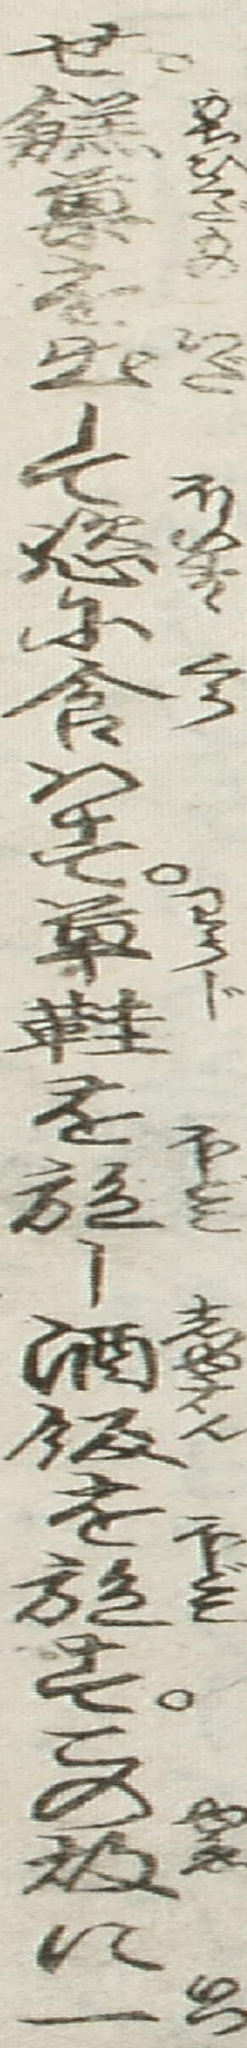せ。餻菓を出して恣に食はす。草鞋を施し酒飯を施す。この故に一
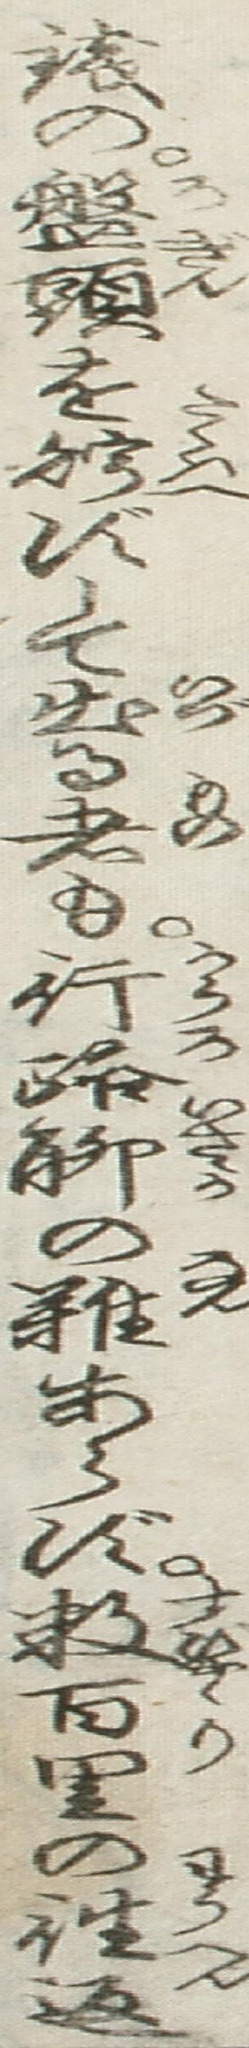銭の。盤頭を貯ずして出る者も。行路聊の難あらず。数百里の往返
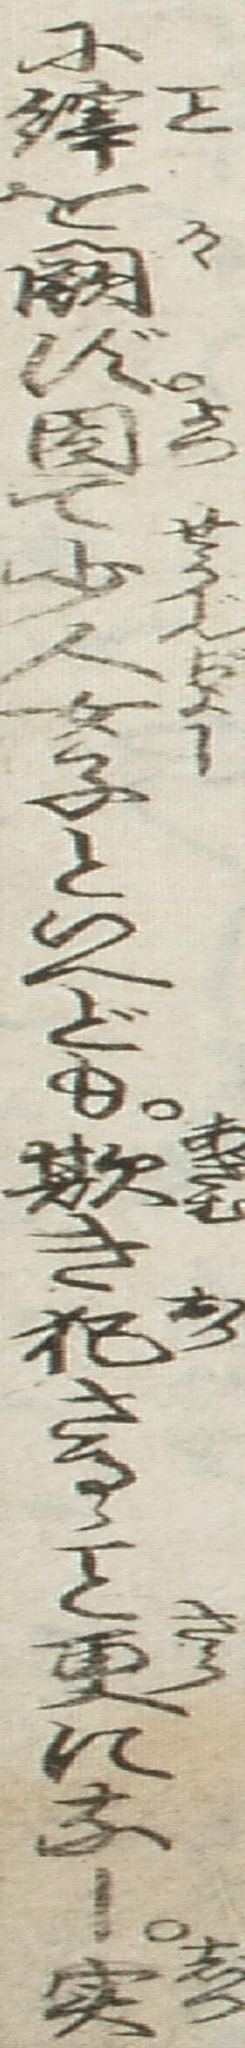に縡を闕ず。因て少人女子といへども。欺き犯さるゝこと更になし。実

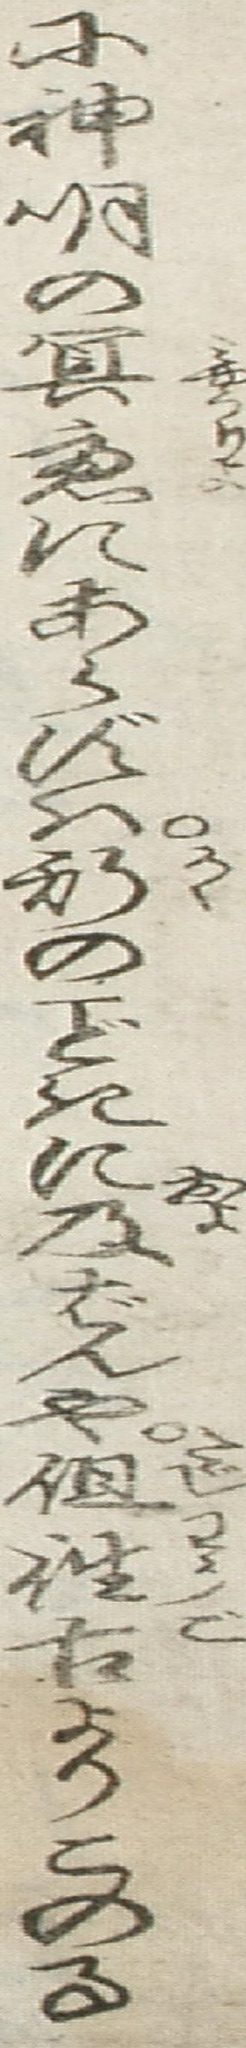に神明の冥慮にあらずは。斯のごときに及ばんや。但往古よりこの事
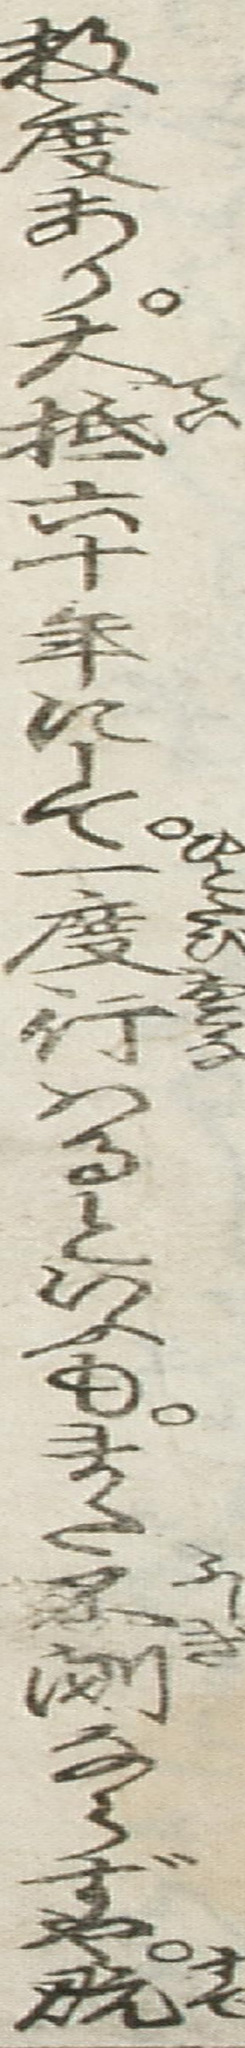数度あり。大抵六十年にして。一度行はるといふも。また不測ならずや。既
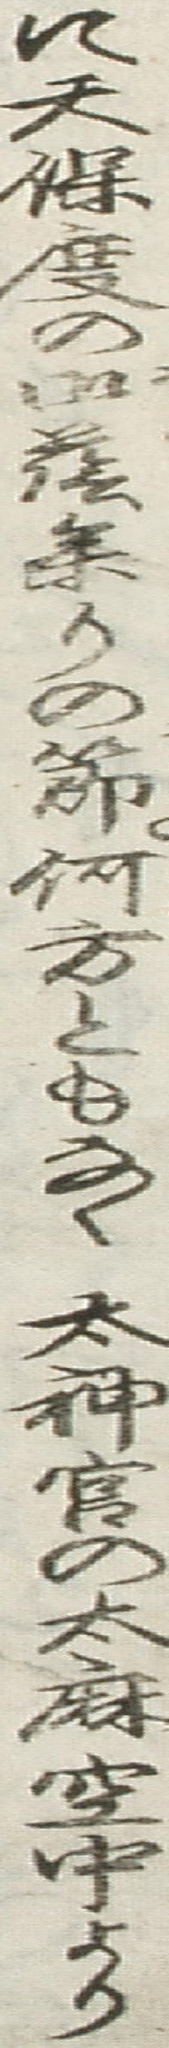に天保度の御蔭参りの節。何方ともなく太神宮の太麻。空中より
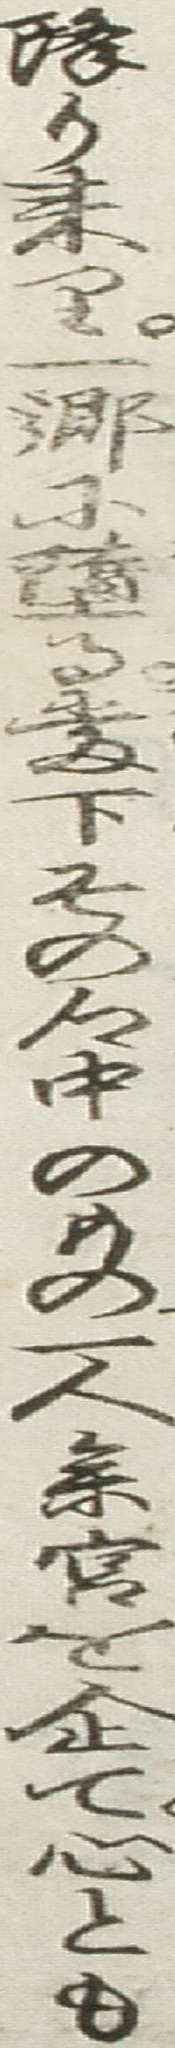降り来り。一郷に堕る。当下その郷中のもの一人。参宮を企て。心とも
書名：安政見聞録　下
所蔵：東京大学地震研究所図書室 Earthquake Research Institute Library, The University of Tokyo, JAPAN
